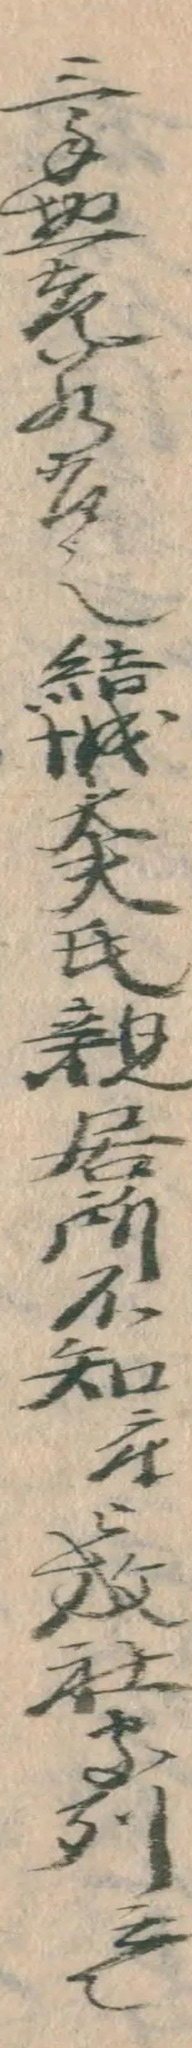三手惣老若有之結城大夫氏親居所不知ニ付被放社家列云々
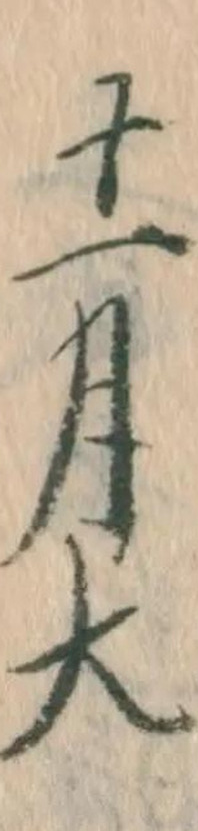十一月大
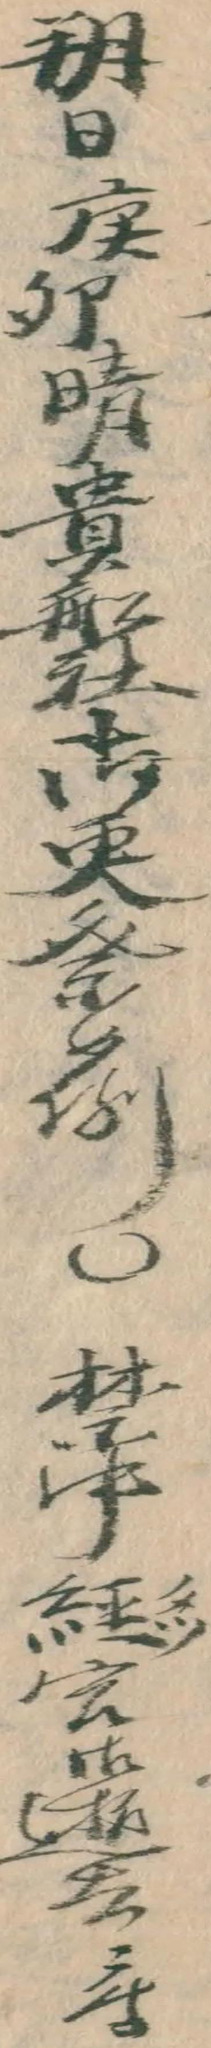朔日庚卯晴貴舩社御更祭如例〇禁中経宮御逝去ニ付
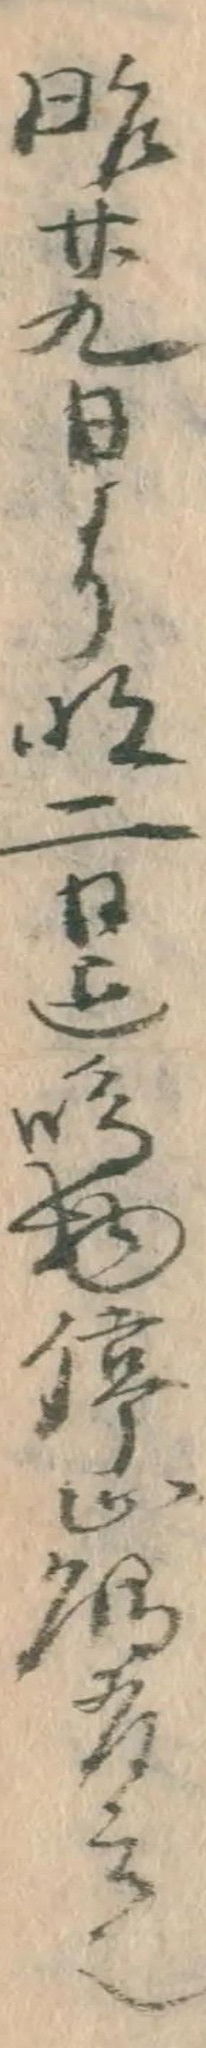昨廿九日より明二日迄鳴物停止觸有之也

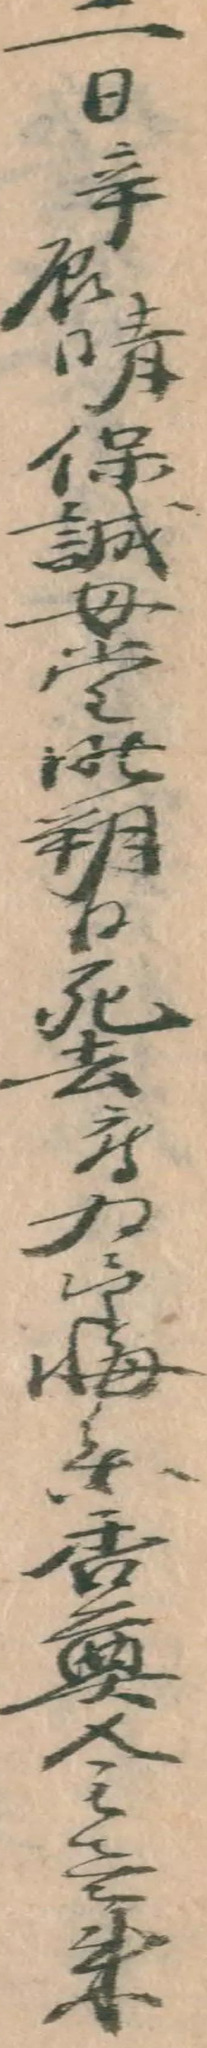二日辛辰晴保誠母堂昨朔日死去ニ付為弔悔香奠金壱朱
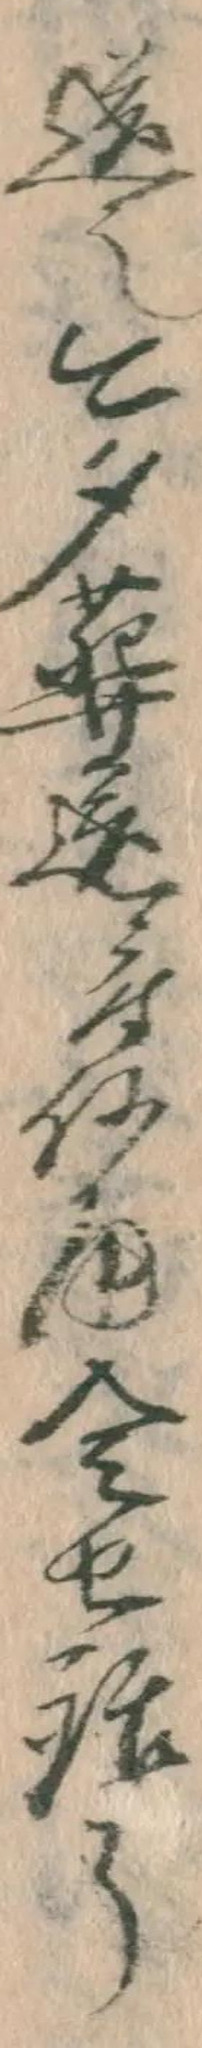送之今夕葬送ニ付何角令世話了
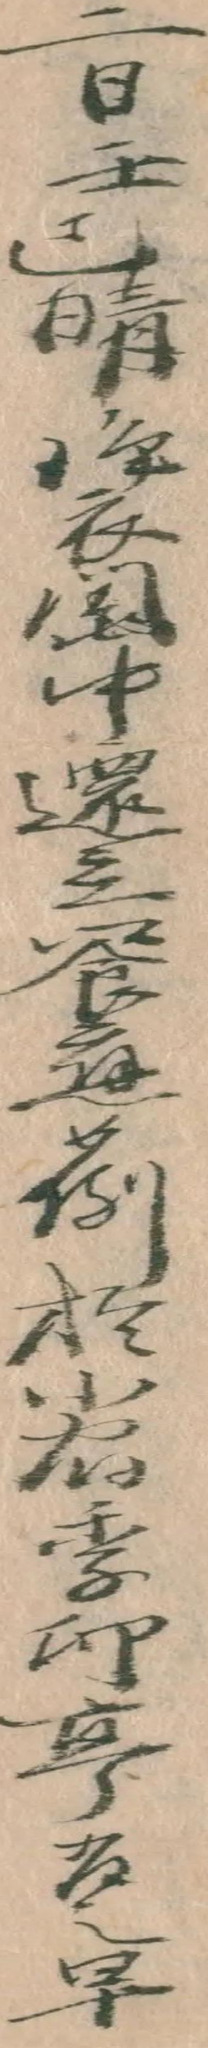三日壬巳晴浄衣弥衣鬮中還立饗應如例於小宿季卯亭有之早
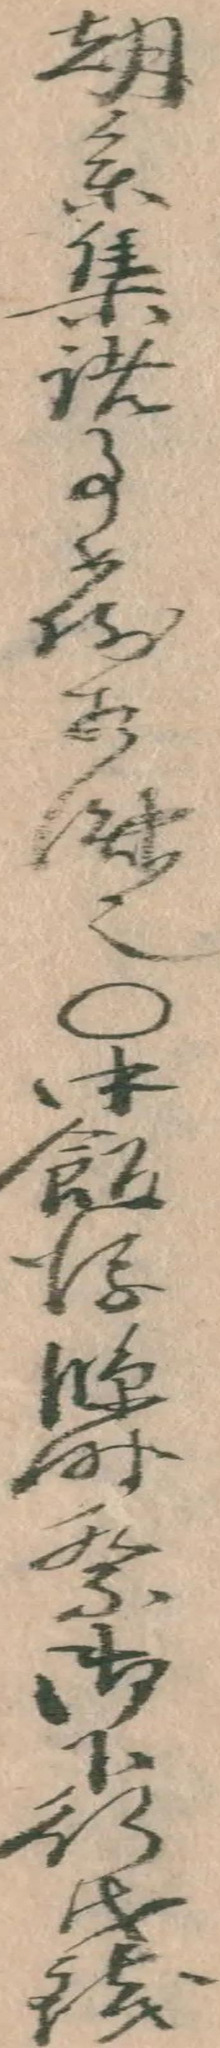朝参集諸事如例相済也○中飯後臨時祭御下行被致
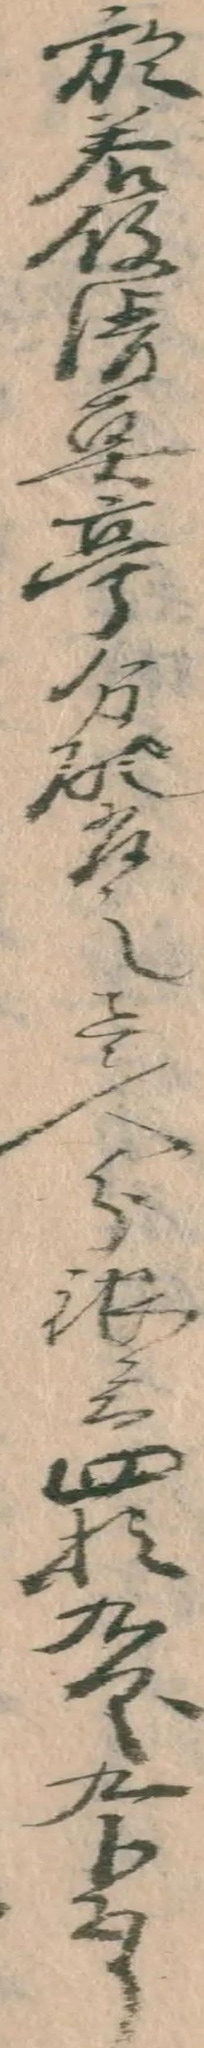於若役清魚亭分配有之壱人分銀ニ而四拾九匁九分五り
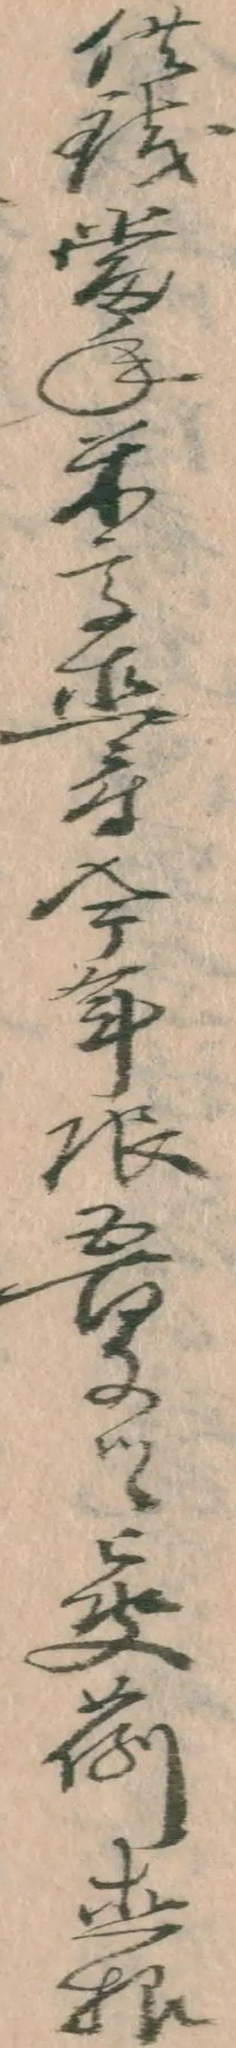供銭當年米高直ニ付今年限五百文ツヽ被決如例直様
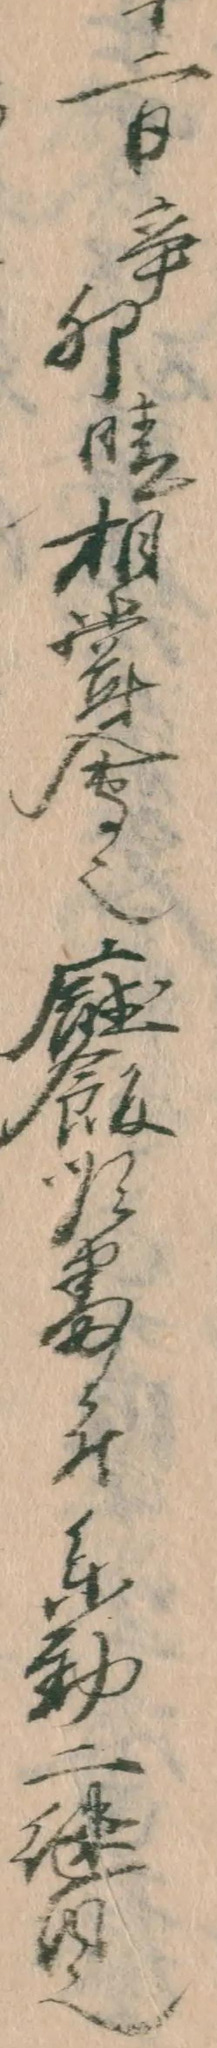十二日辛卯晴相甞会也廳飯順番ニ付参勤二継目也
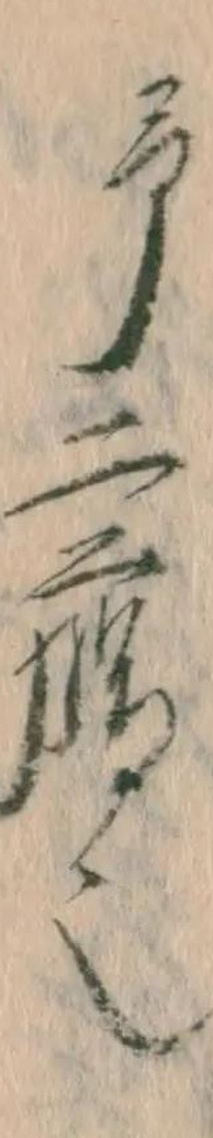予二臈也
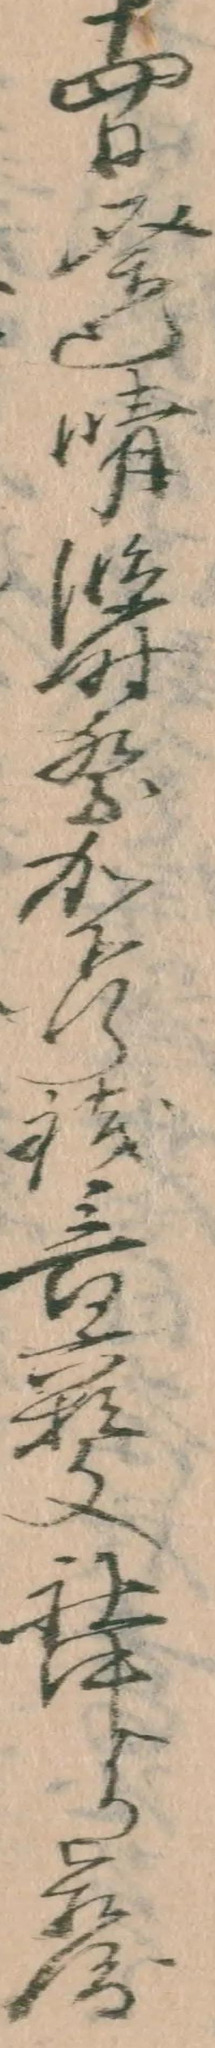十四日癸巳晴臨時祭加下行銭三百六拾文社中より被相渡
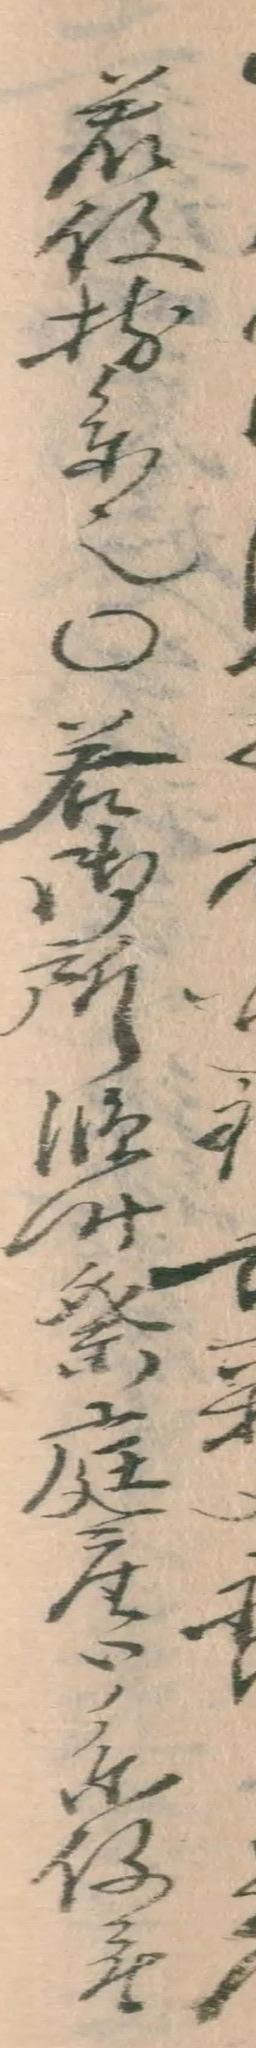若役持参也○若御所臨時祭庭座御参役ニ付
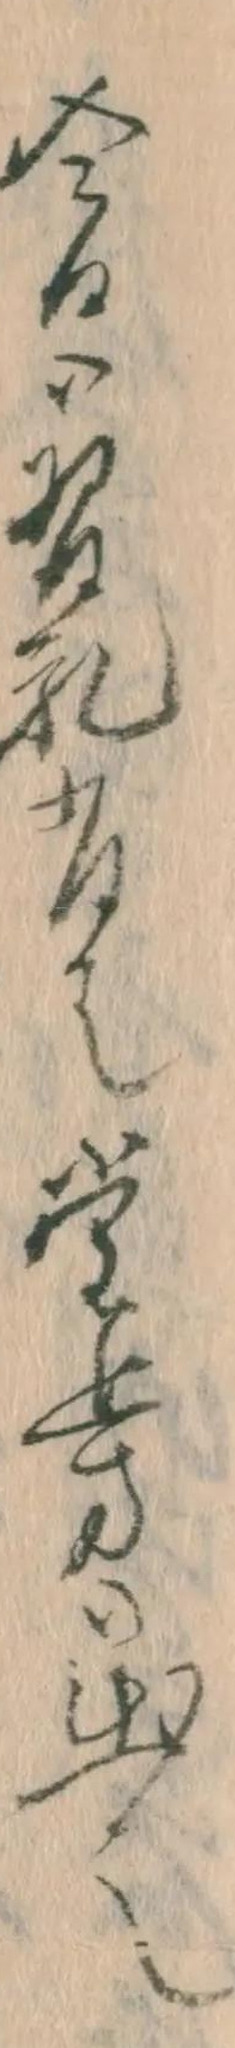今日御習礼有之堂上方御出也
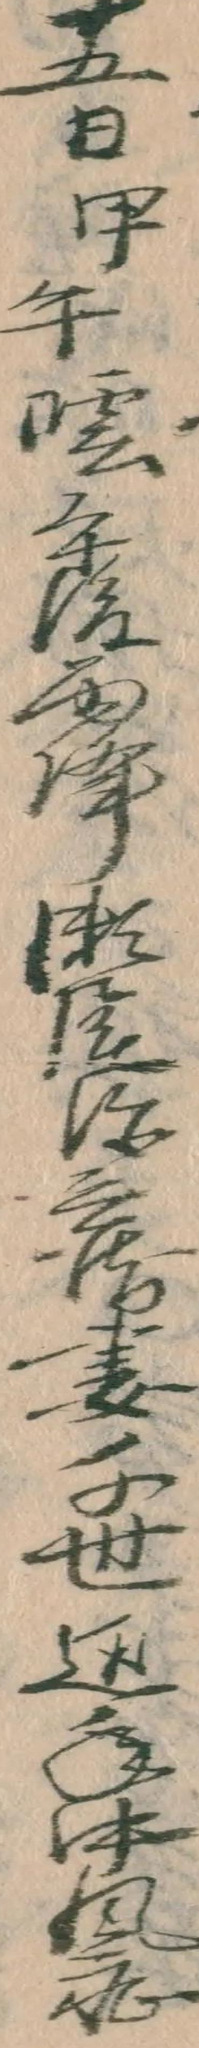十五日甲午曇午後雨降瀬尾弥兵衛妻千世近年中風病
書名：賀茂社記録. 第67冊
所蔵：国立国会図書館 National Diet Library, JAPAN
